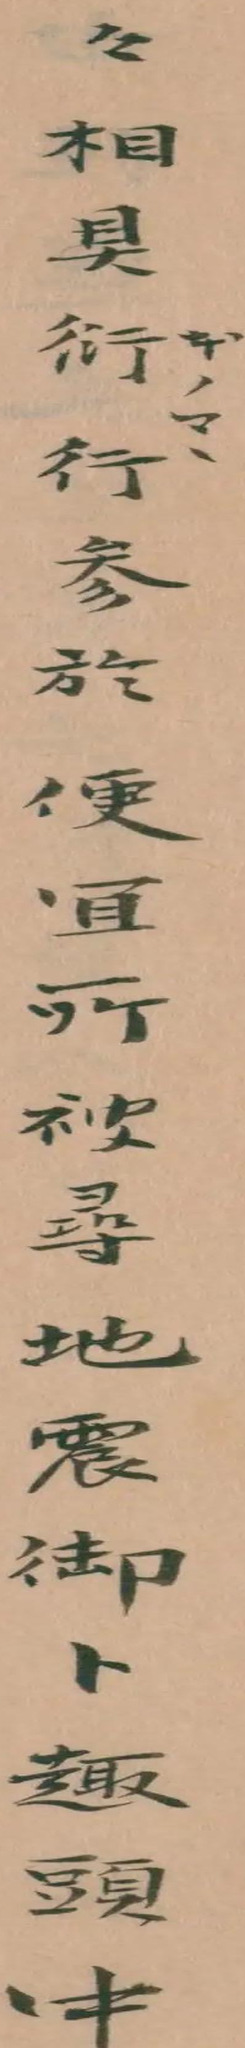々相具衍行参於便宜所被尋地震御卜趣頭中
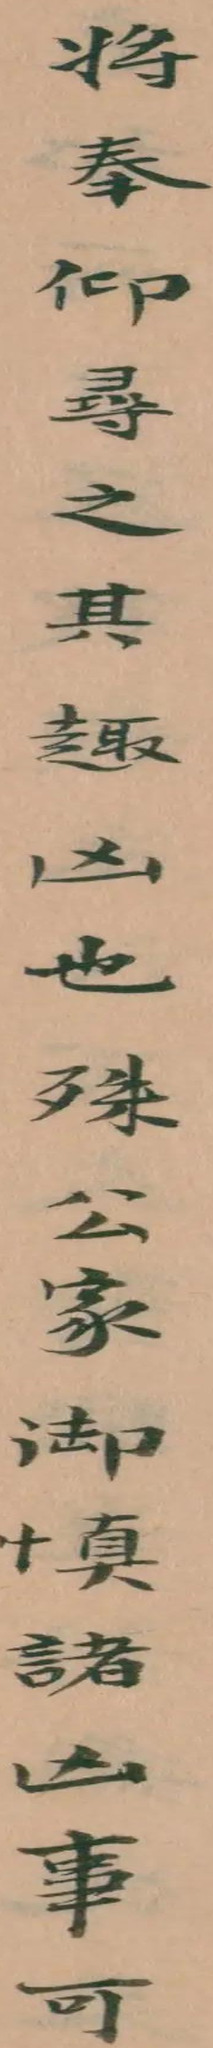将奉仰尋之其趣凶也殊公家御慎諸凶事可
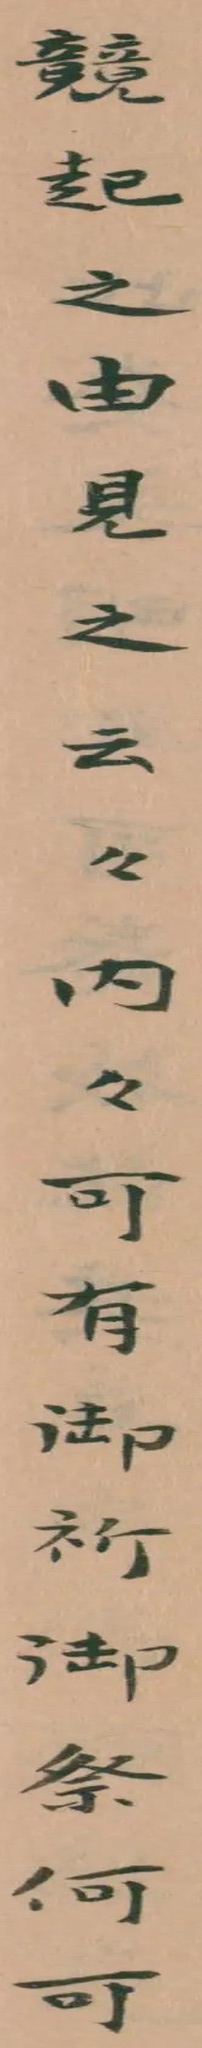競起之由見之云々内々可有御祈御祭何可
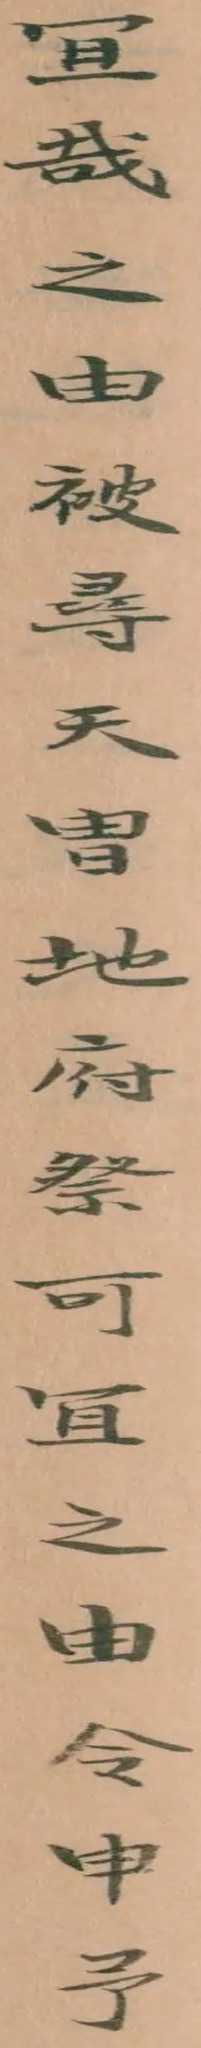宜哉之由被尋天胄地府祭可宜之由令申予
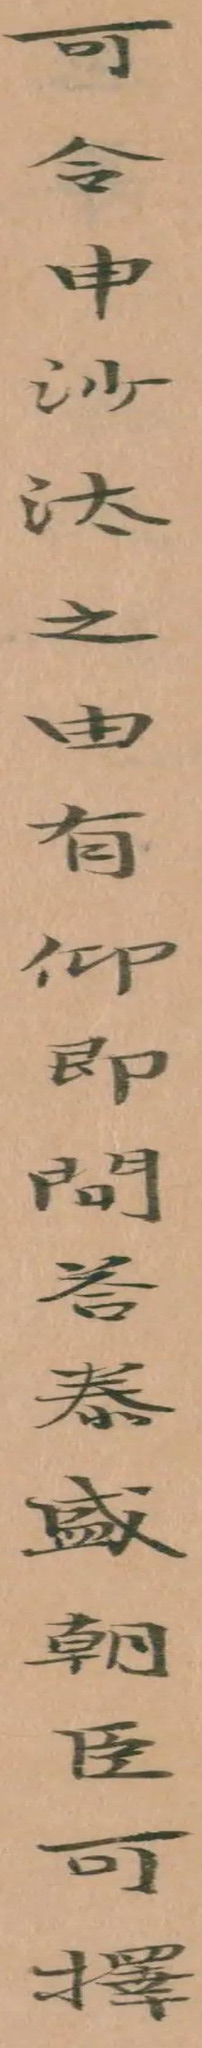可令申沙汰之由有仰即問答泰盛朝臣可択
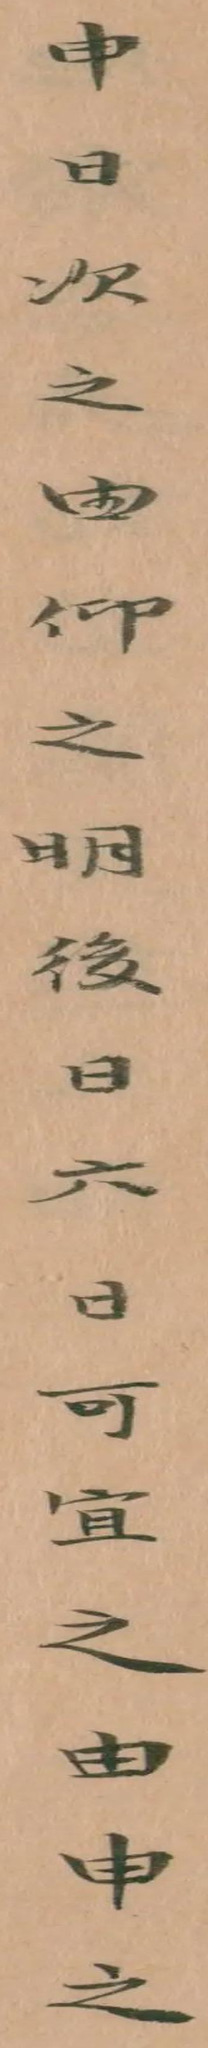申日次之由仰之明後日六日可宜之由申之
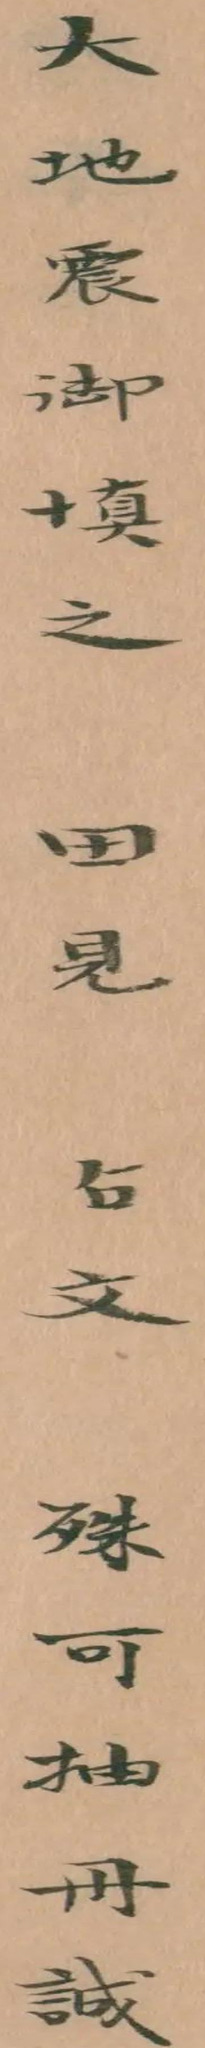大地震御慎之田見占文殊可抽丹誠
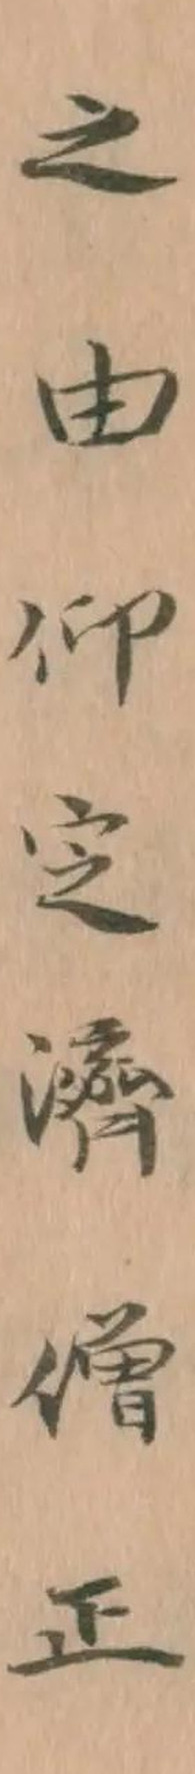之由仰定済僧正
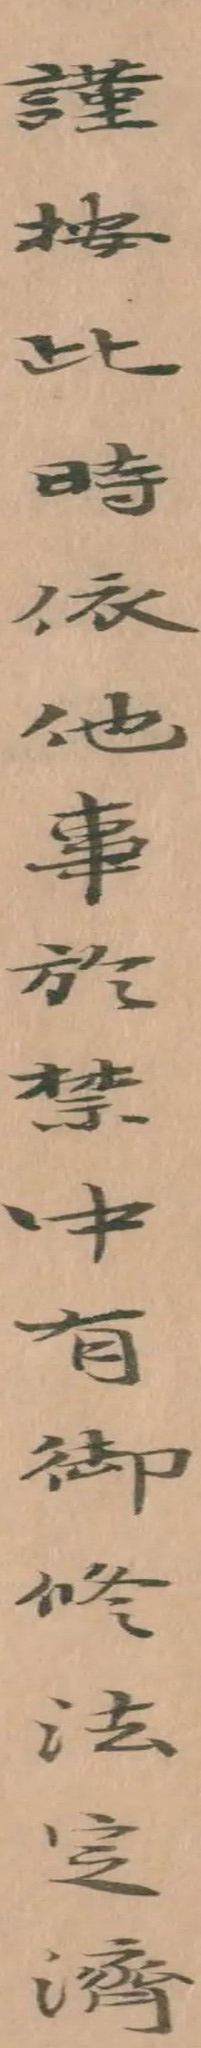謹按此時依他事於禁中有御修法定済
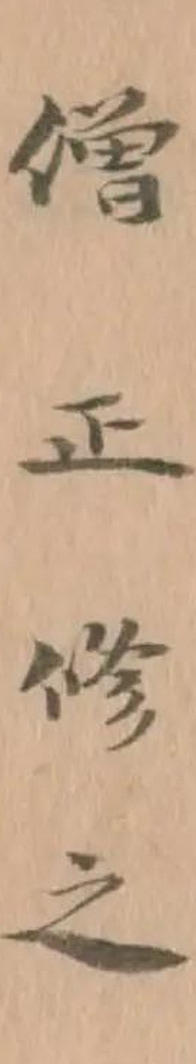僧正修之
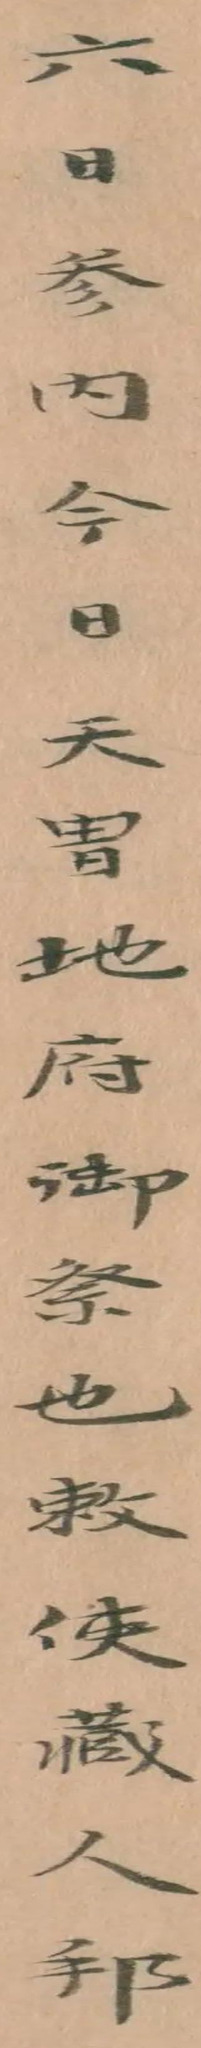六日参内今日天胄地府御祭也敇使蔵人邦

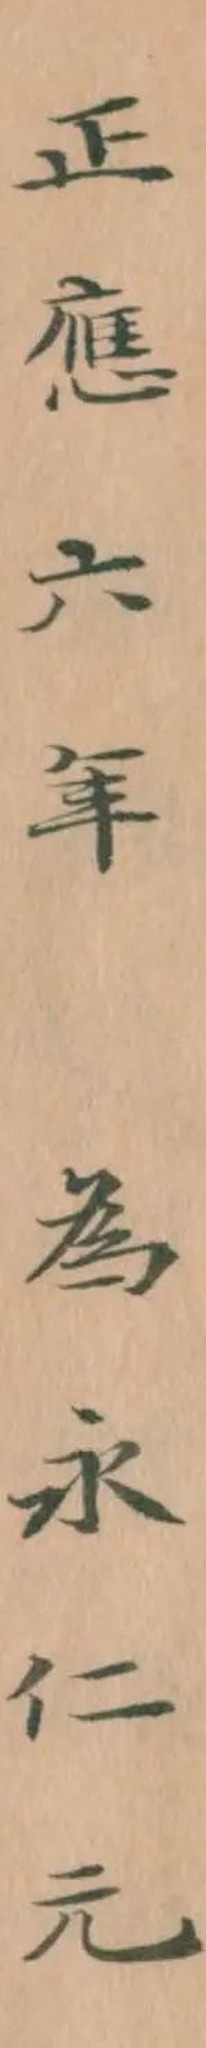正応六年為永仁元
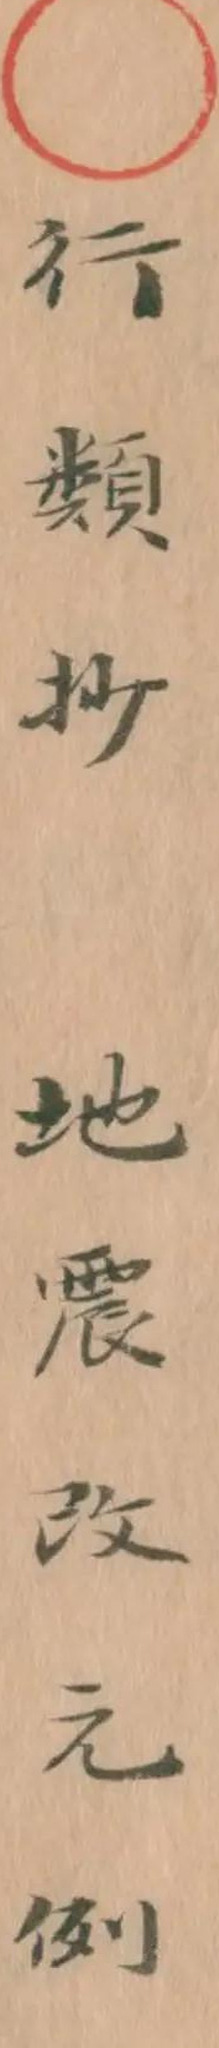○行類抄地震改元例
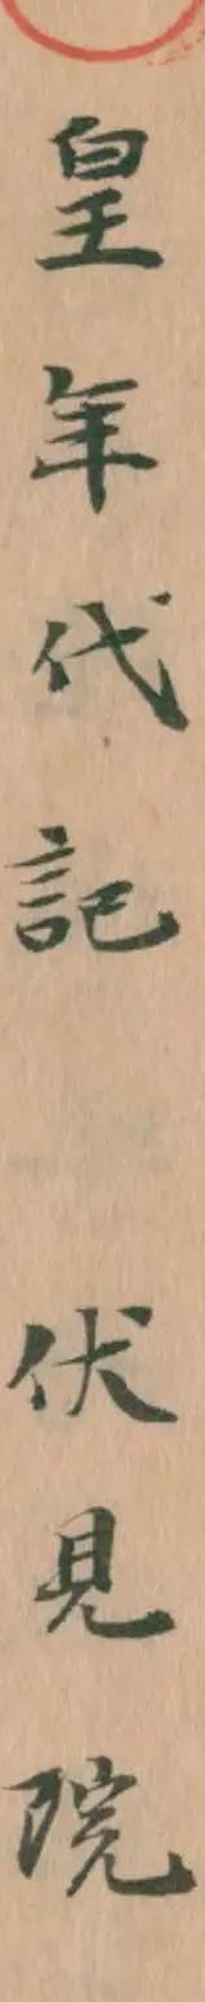○皇年代記伏見院
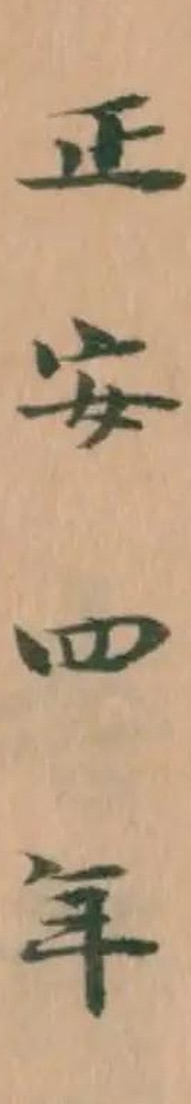正安四年
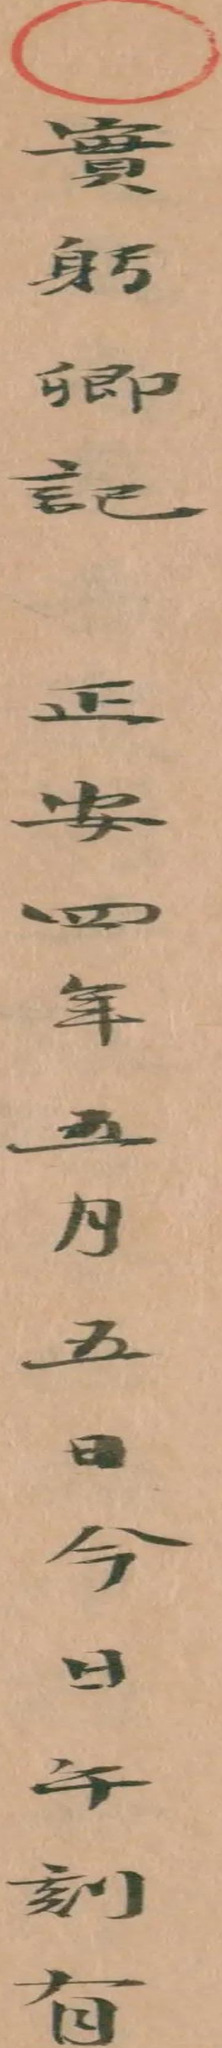○実躬卿記正安四年五月五日今日午刻有
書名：地災撮要. 巻5-6(地震之部)
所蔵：国立国会図書館 National Diet Library, JAPAN
